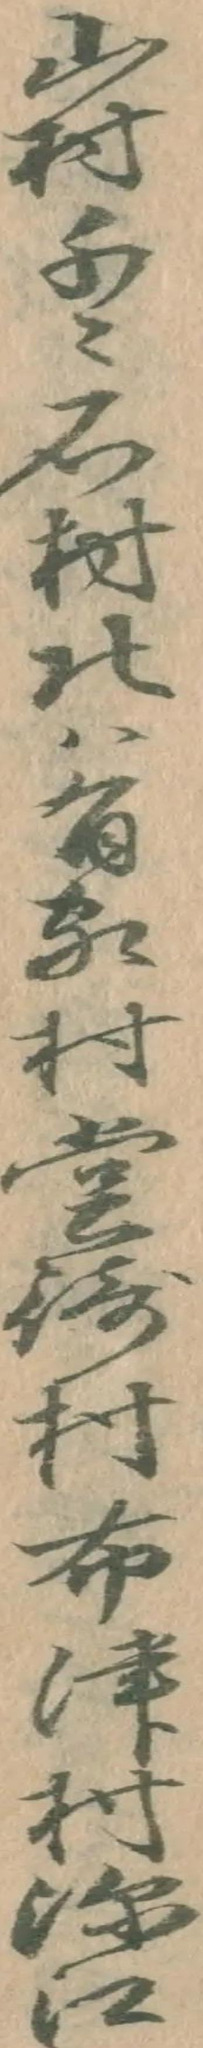山村千々石村北は有家村堂崎村布津村深江
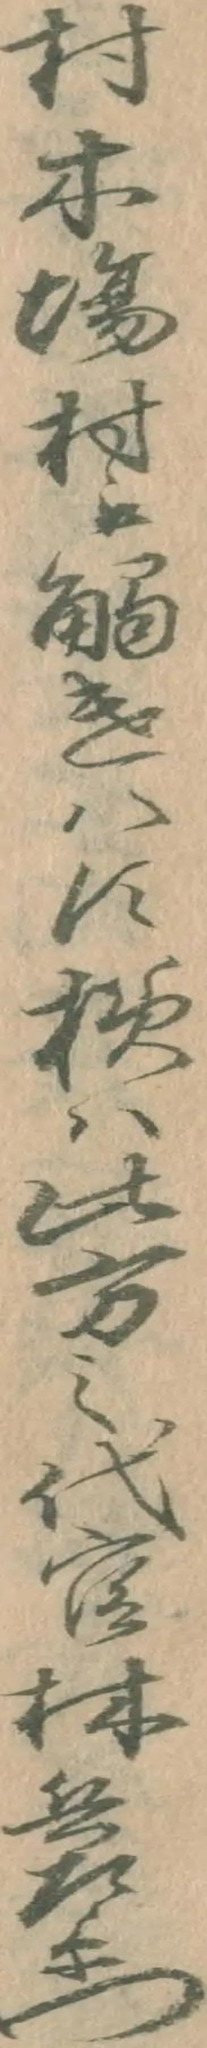村木場村え触遣はす様は此方之代官林兵左衛門

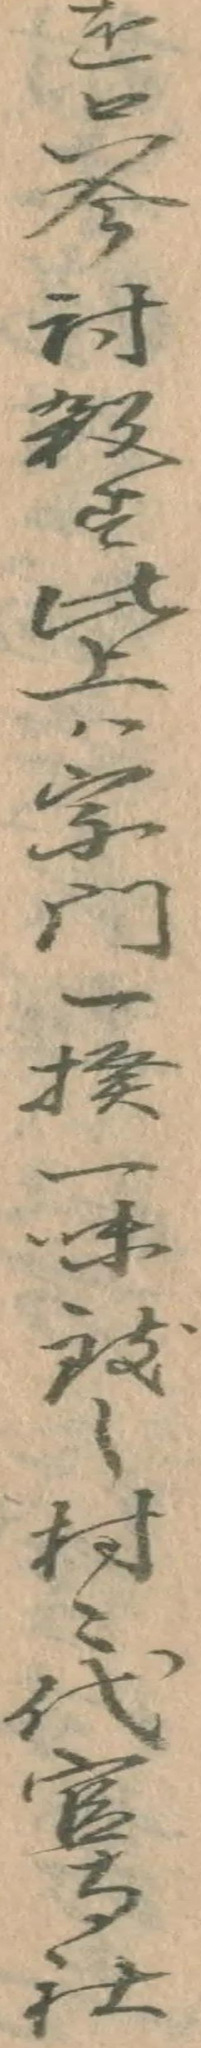を只今討殺す此上は宗門一揆一味致し村々代官寺社
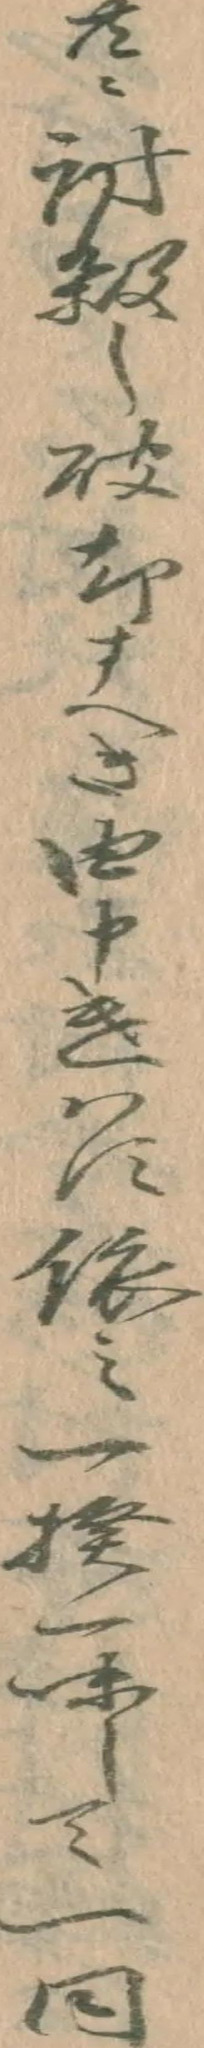共に討殺し破却すへき由申遣はす依之一揆一味して一同
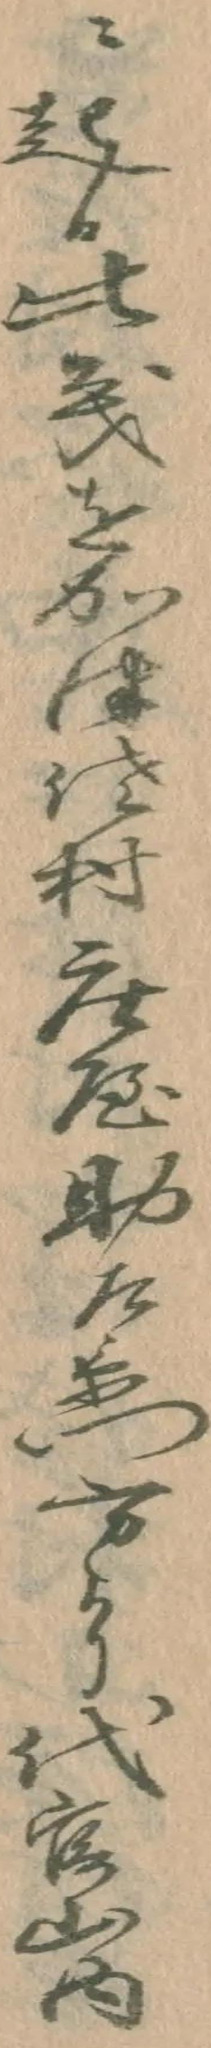に起る此義を加津佐村庄屋助左衛門方より代官山内
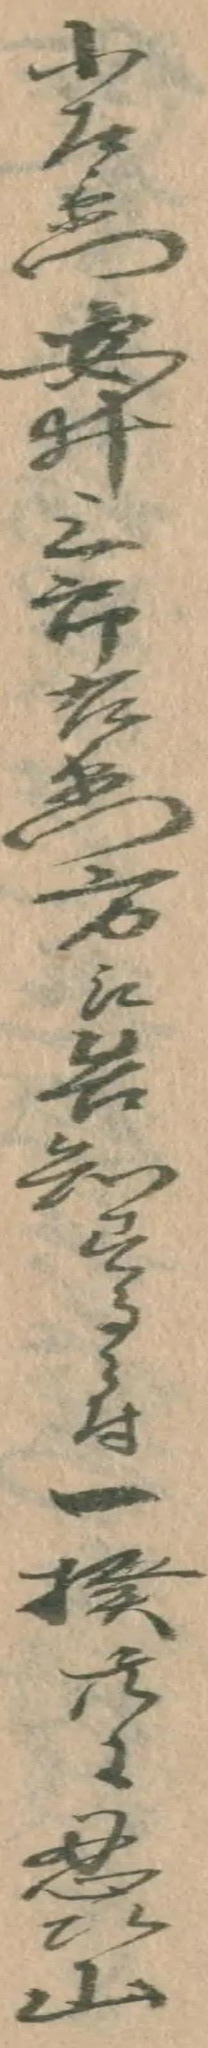小左衛門安井三郎右衛門方え告知するに付一揆共に忍ひ山
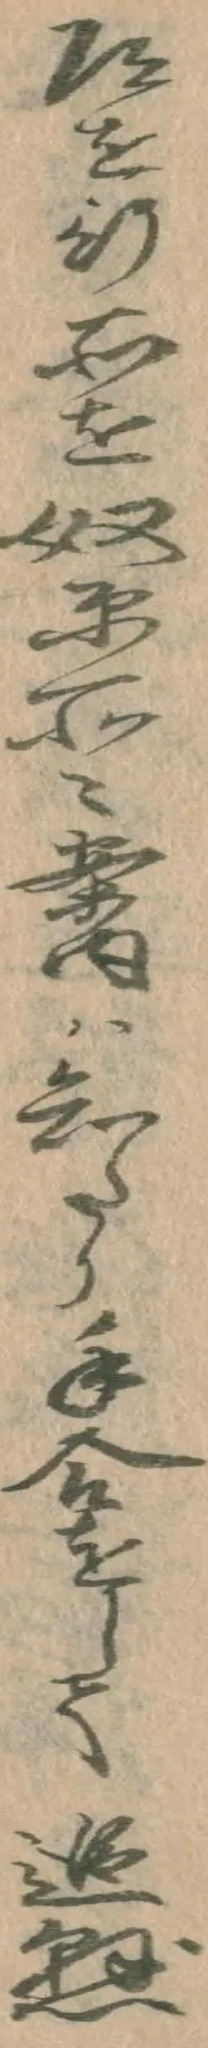道を行所を奴原所々案内は知たり手合をして追懸
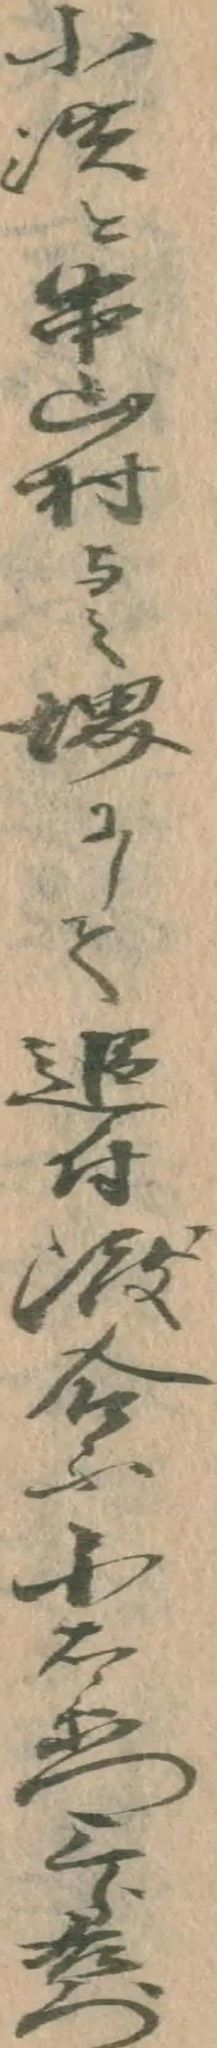小浜と串山村与之堺にして追付渡合ふ小右衛門三郎右衛門
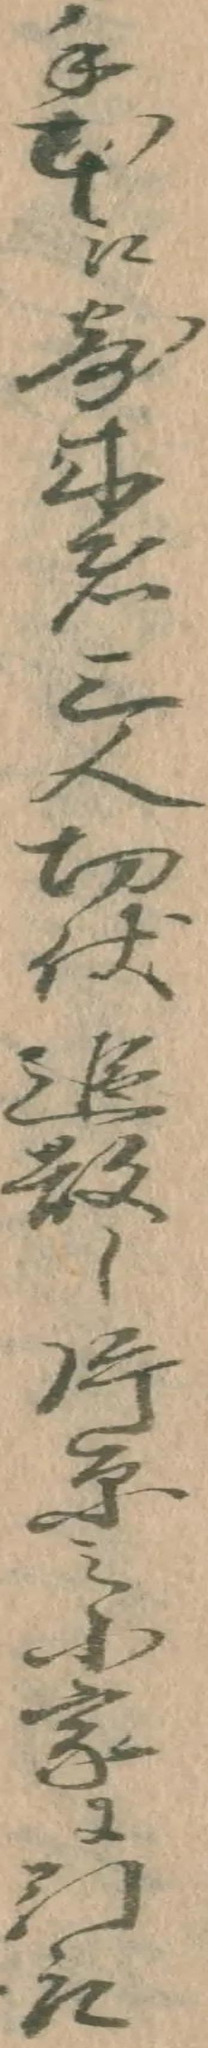手本え寄来者三人切伏追散し片原之小家に引取
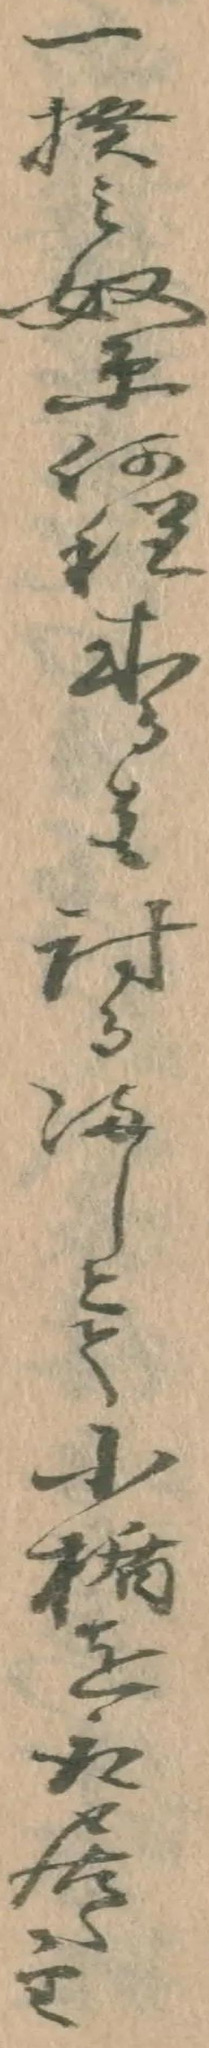一揆之奴原何程来とも討るましとて小楯を取居たり
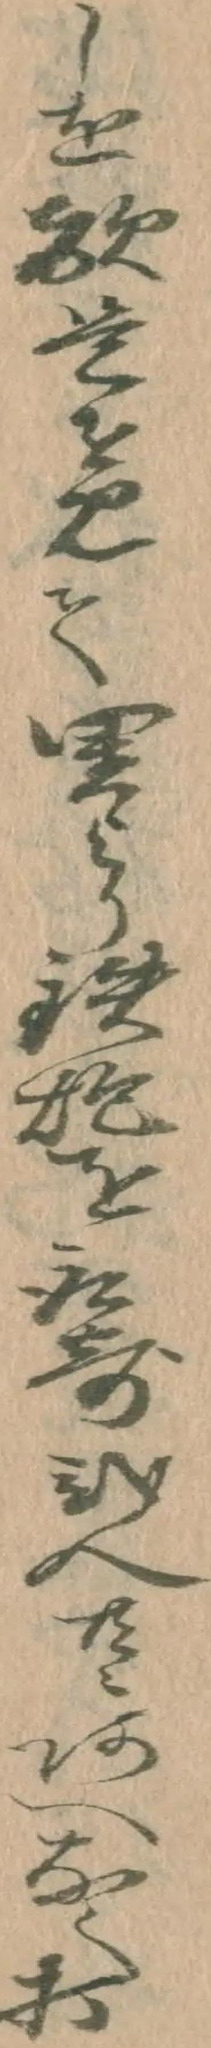しを敵是を見て里より鉄炮を取寄弐人共にあへなく打
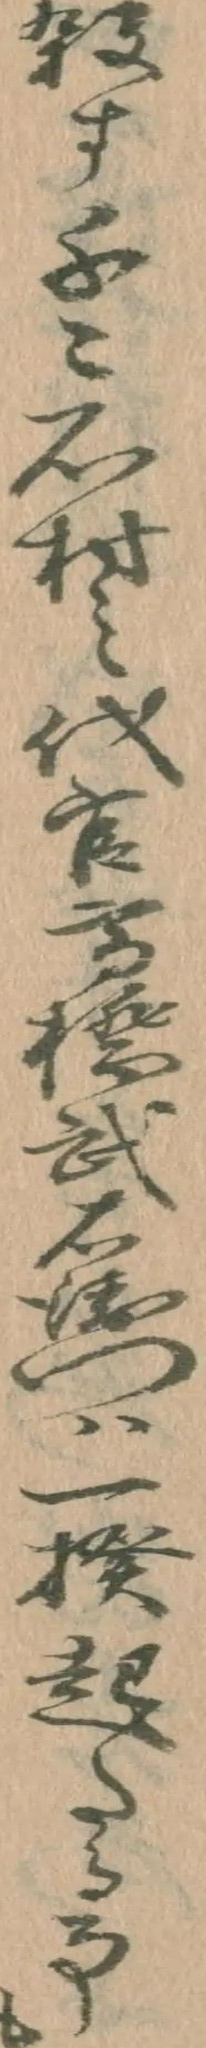殺す千々石村之代官高橋武右衛門は一揆起たる事も
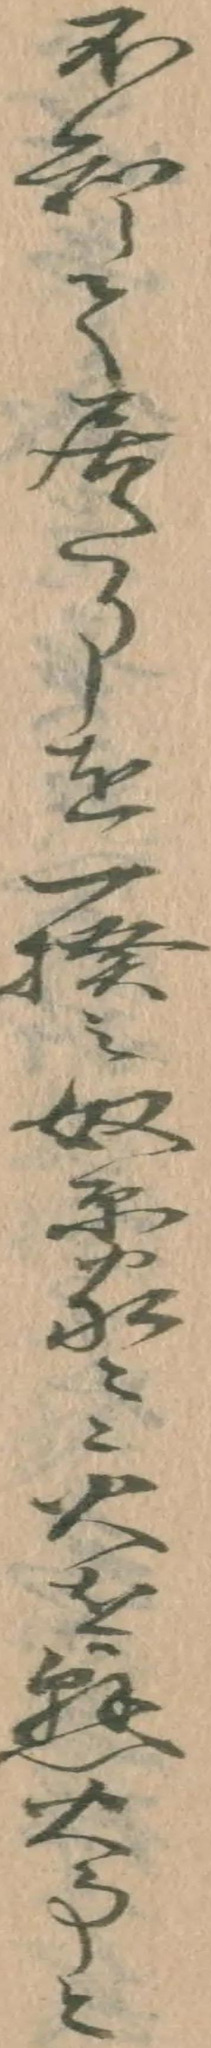不知して居たりしを一揆之奴原家々に火を懸火事と
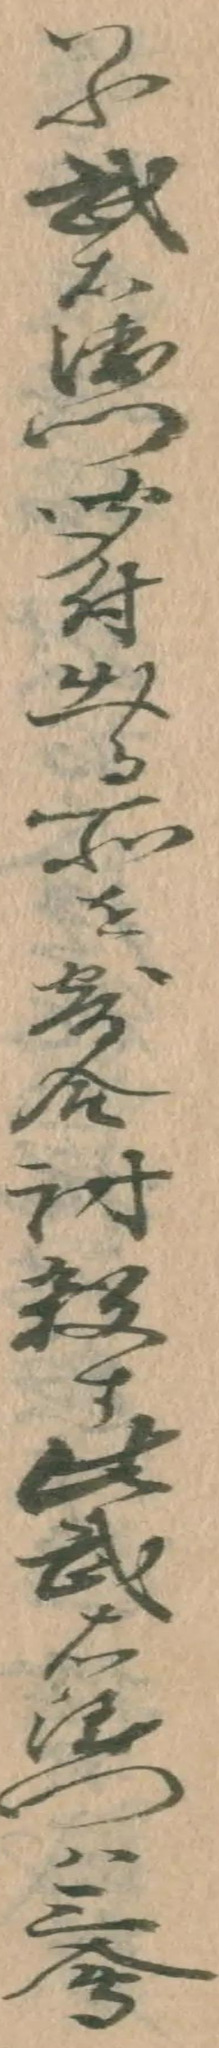いふ武右衛門聞付出る所を寄合討殺す此武右衛門は三会
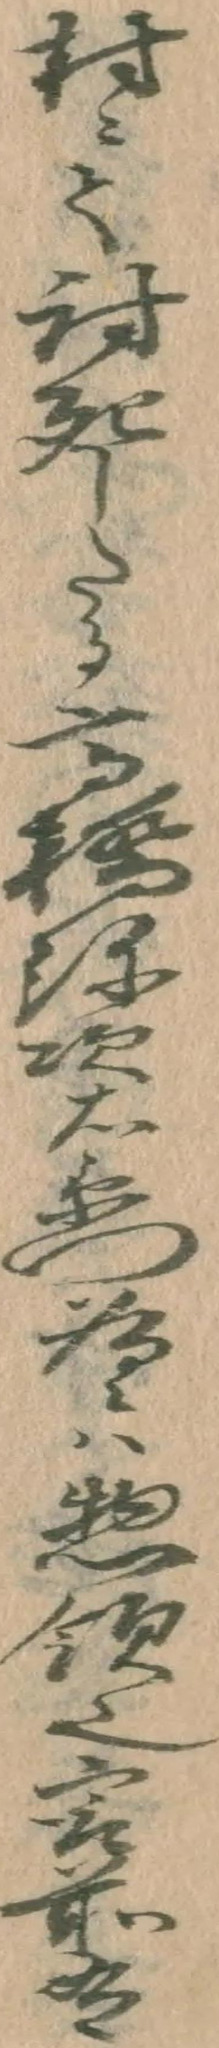村にて討死したる高橋弥次右衛門為には惣領也最前有
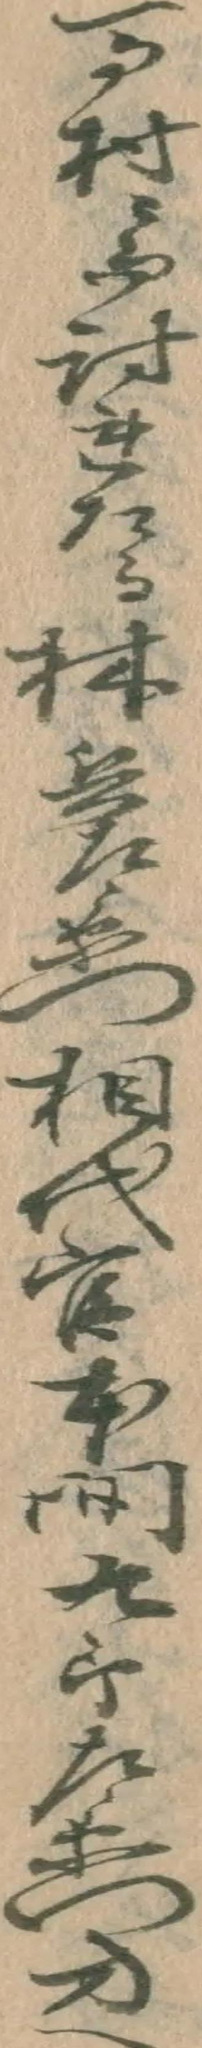馬村に而討れたる林兵左衛門相代官本間九郎左衛門方へ
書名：切支丹御退治記 49巻. [1]
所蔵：国立国会図書館 National Diet Library, JAPAN
